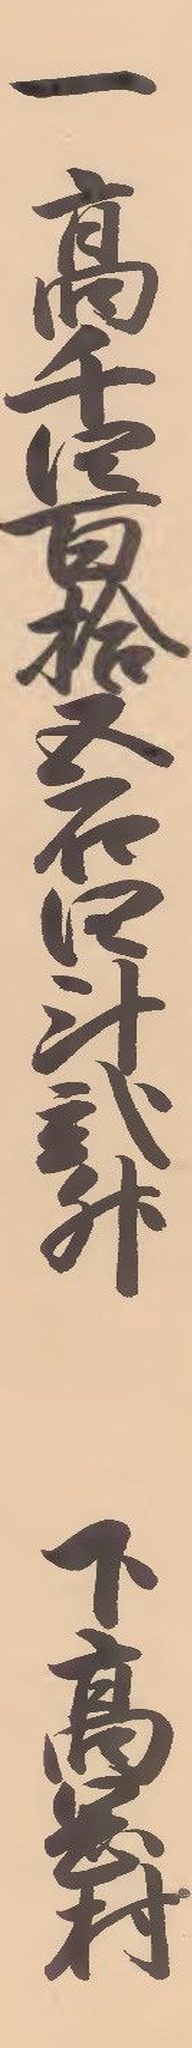一高千四百拾五石四斗弐升下高岡村
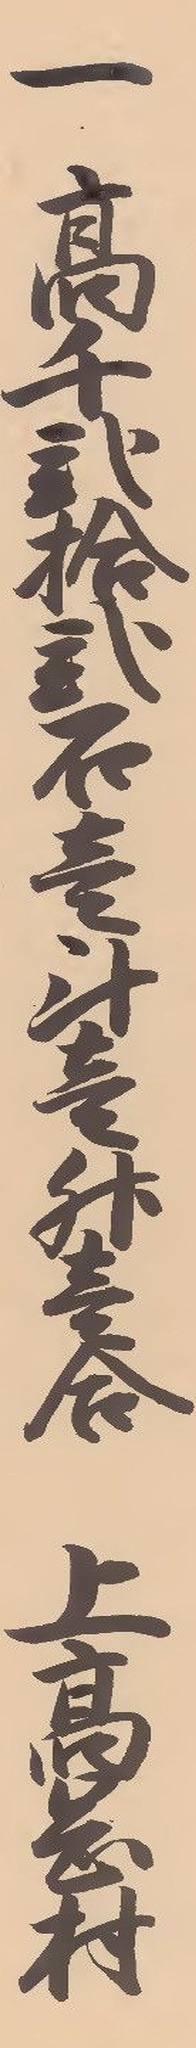一高千弐拾弐石壱斗壱升壱合上高岡村
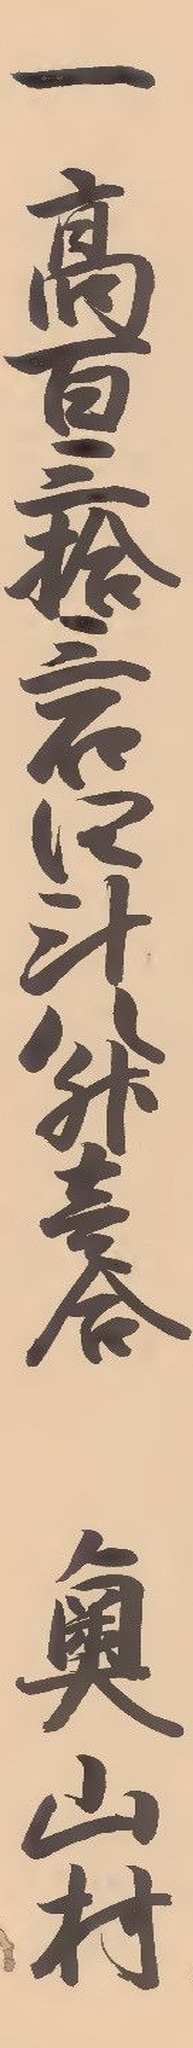一高百三拾三石四斗八升壱合奥山村
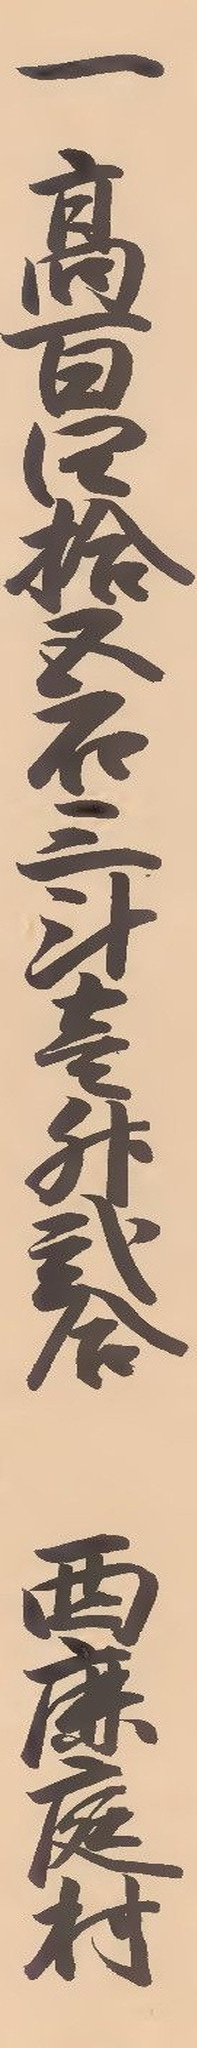一高百四拾五石三斗壱升弐合西鹿庭村
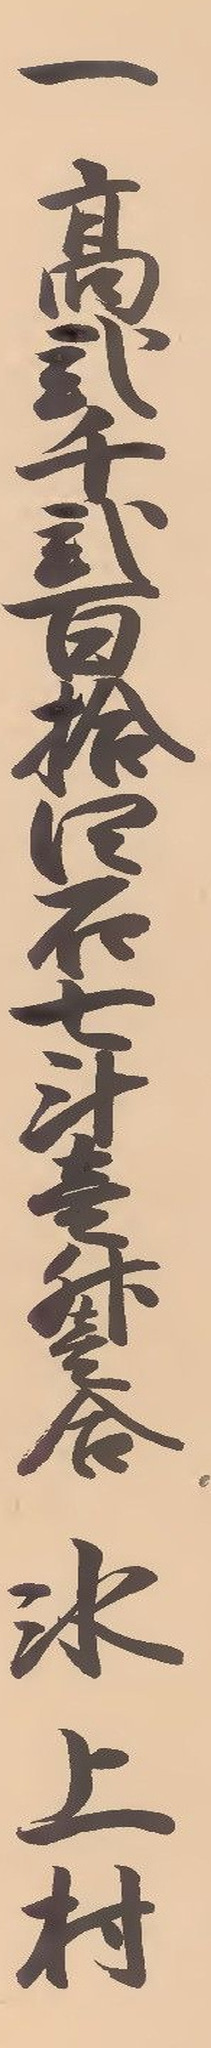一高弐千弐百拾四石七斗壱升壱合氷上村
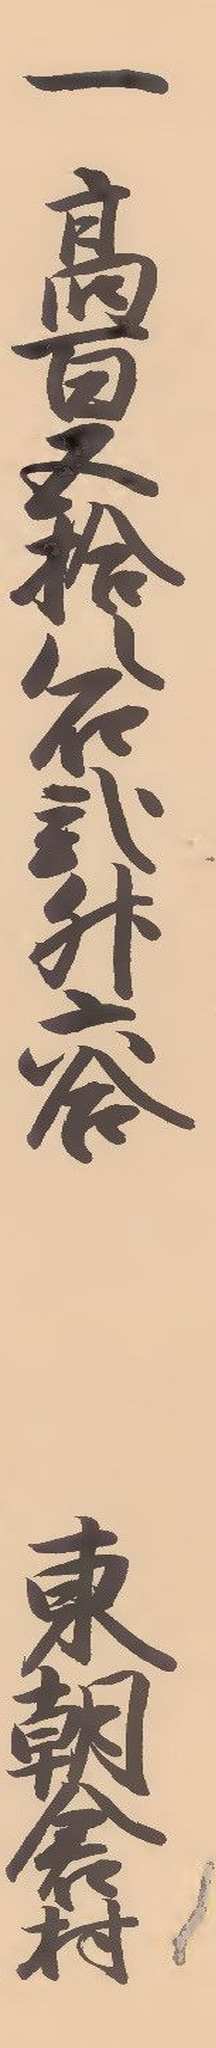一高百五拾八石弐升六合東朝倉村
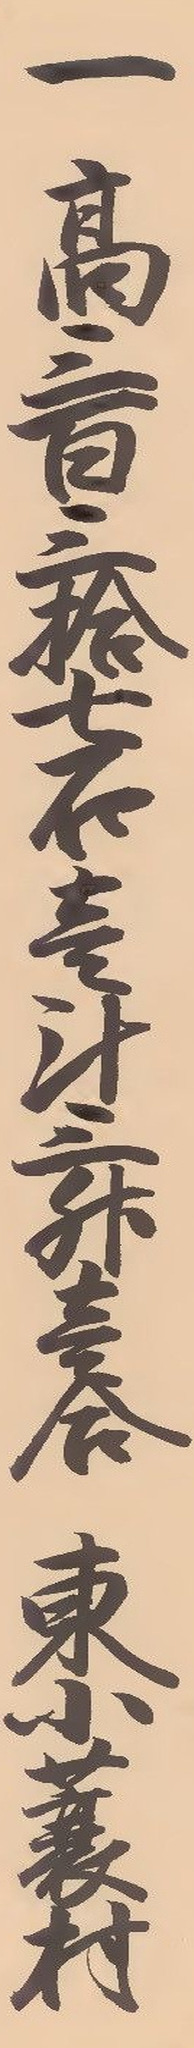一高三百三拾七石壱斗三升壱合東小簔村
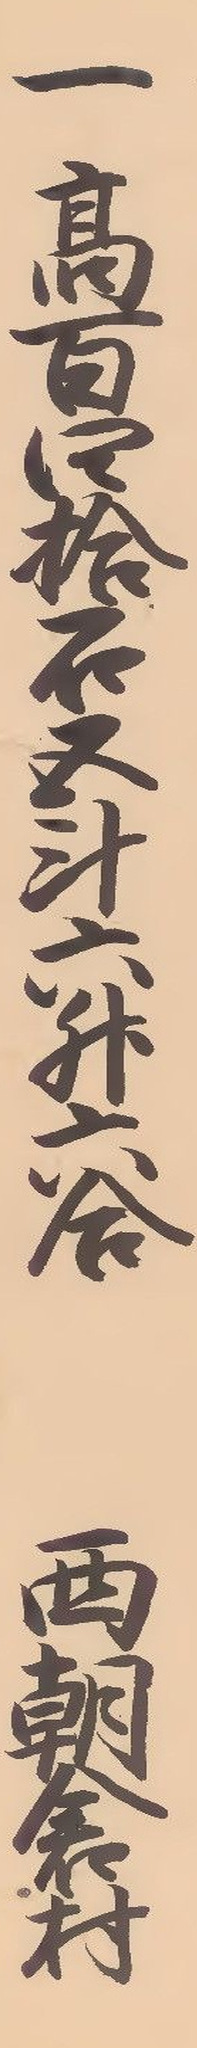一高百四拾石五斗六升六合西朝倉村

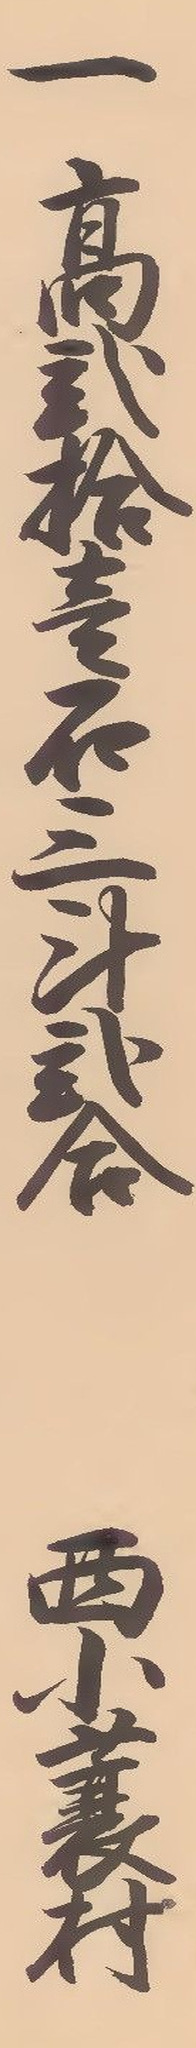一高弐拾壱石三斗弐合西小簔村
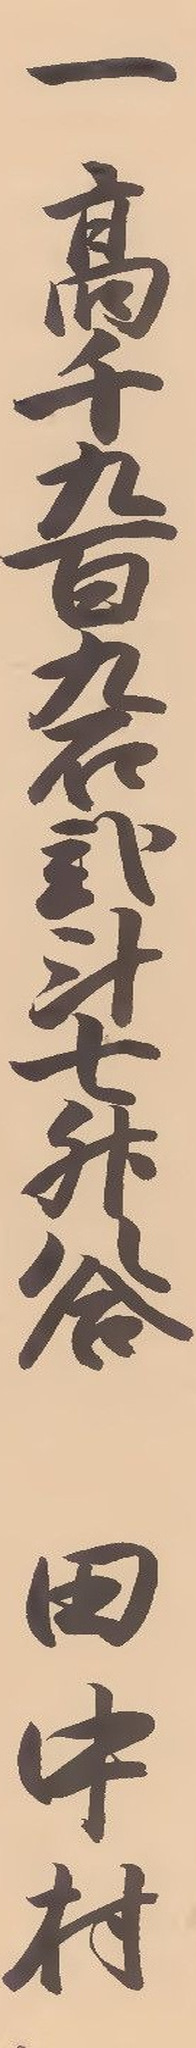一高千九百九石弐斗七升八合田中村
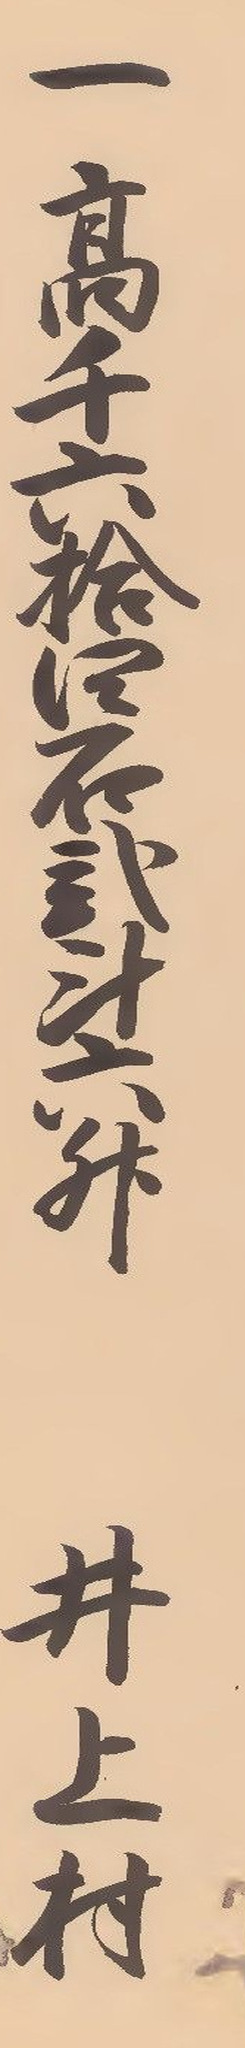一高千六拾四石弐斗六升井上村
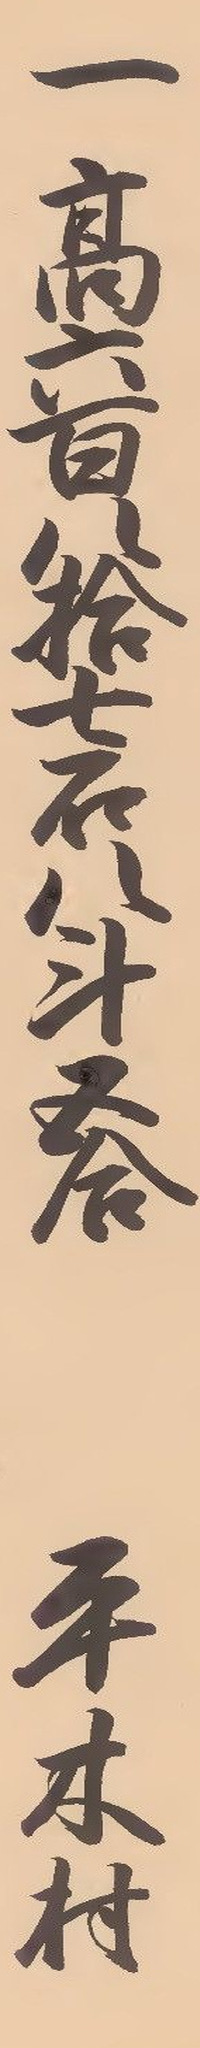一高六百八拾七石八斗五合平木村
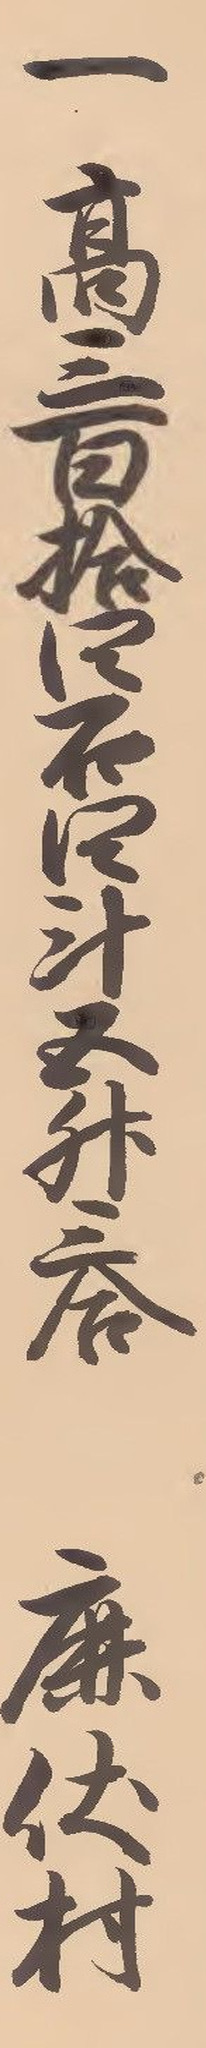一高三百拾四石四斗五升三合鹿伏村
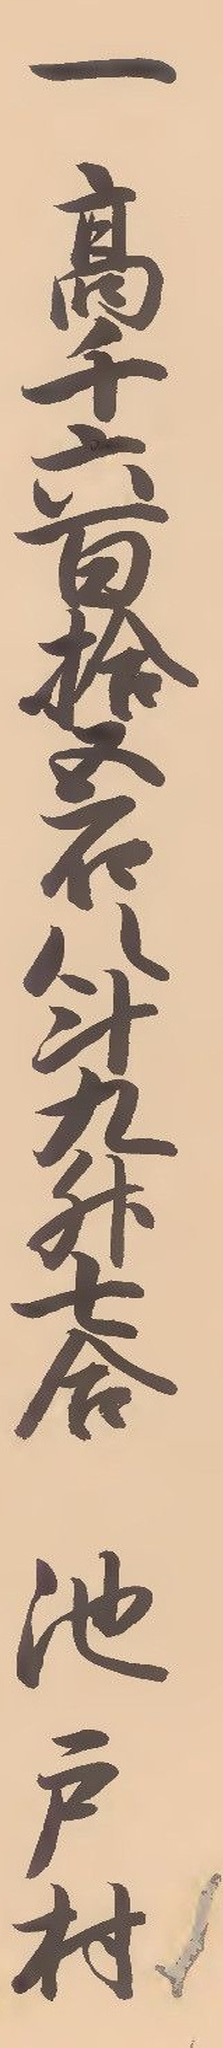一高千六百拾五石八斗九升七合池戸村
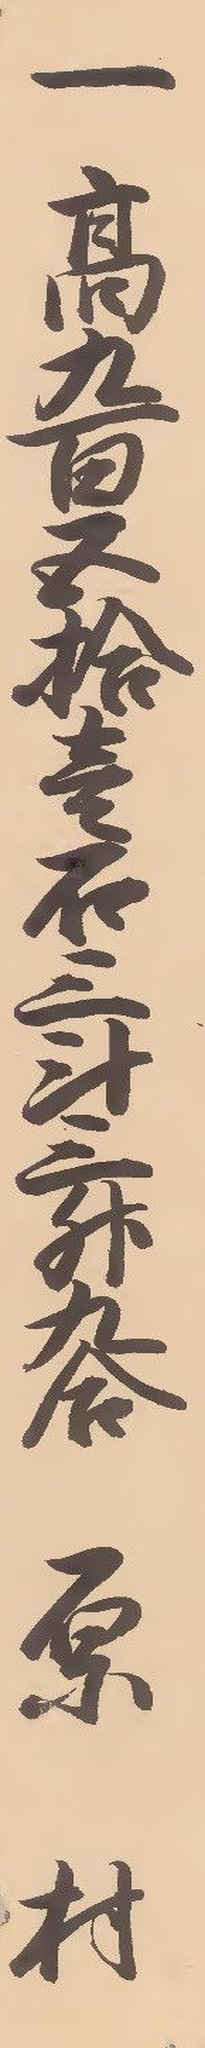一高九百五拾壱石三斗三升九合原村
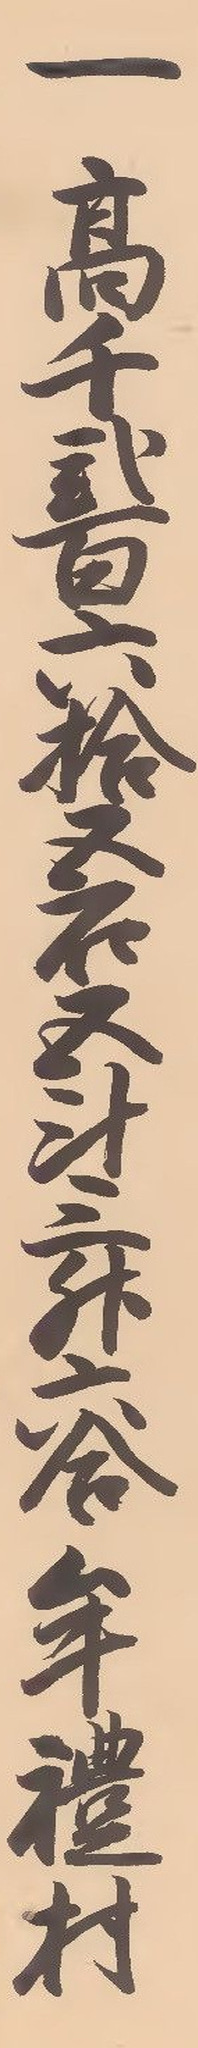一高千弐百六拾五石五斗三升六合牟礼村
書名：讃岐国郷帳
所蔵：国立公文書館 National Archives of Japan
